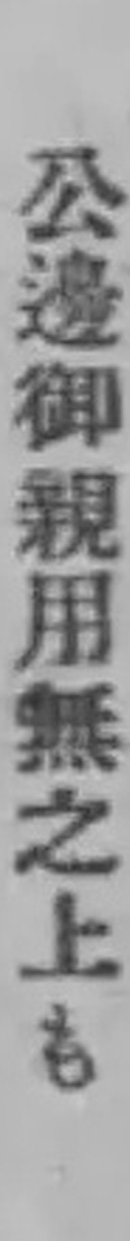公辺御親用無之上も
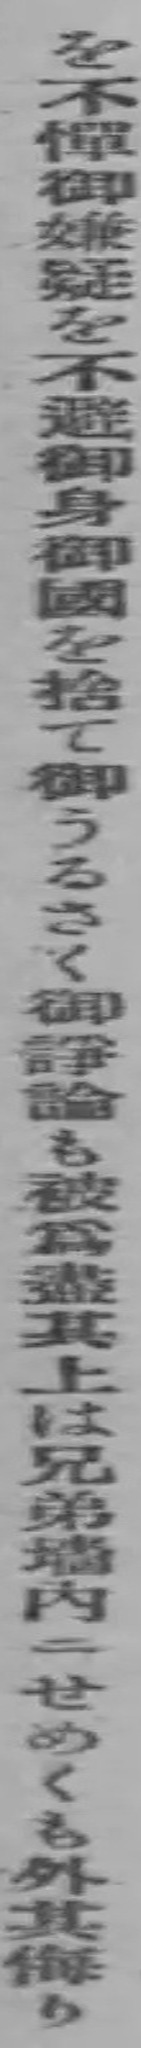を不憚御嫌疑を不避御身御国を捨て御うるさく御諍論も被為盡其上は兄弟墻内ニせめくも外其侮り

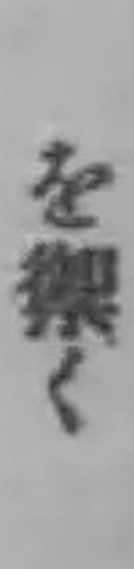を禦く
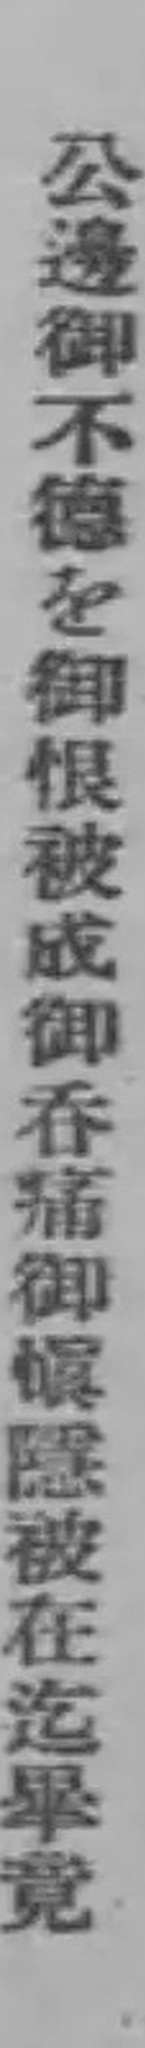公辺御不徳を御恨被成御呑痛御慎隠被在迄畢竟
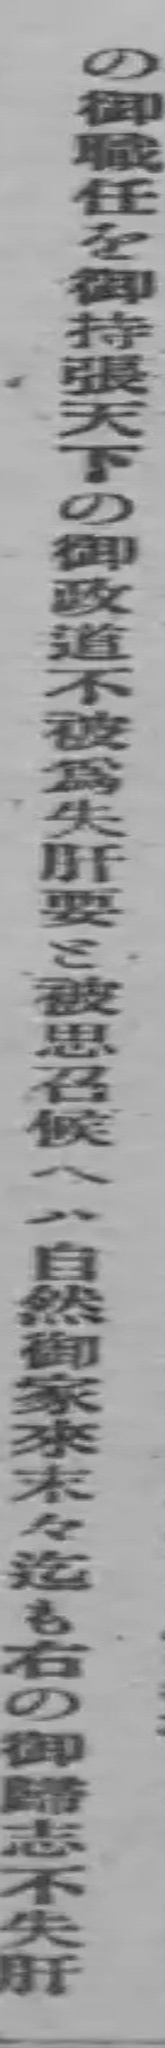の御職任を御持張天下の御政道不被為失肝要と被思召候へは自然御家来末々迄も右の御帰志不失肝
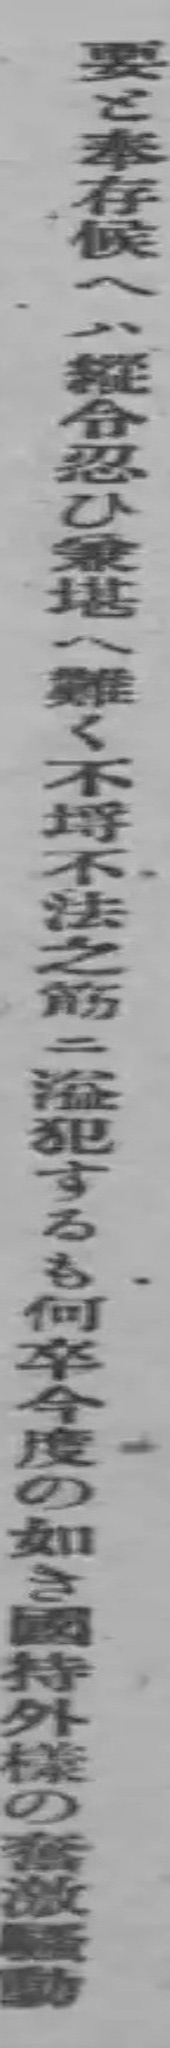要と奉存候へは縦令忍ひ兼堪へ難く不埒不法之筋ニ溢犯するも何卒今度の如き国持外様の奮激騒動
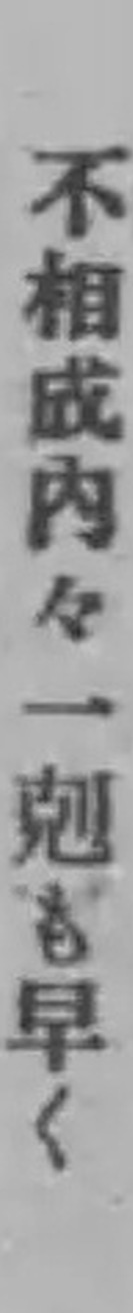不相成内々一剋も早く
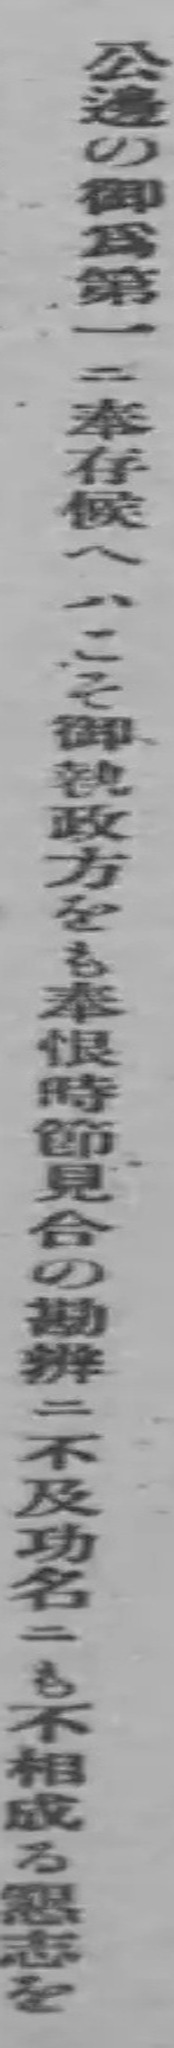公辺の御為第一ニ奉存候へはこそ御執政方をも奉恨時節美合の勘弁ニ不及功名ニも不相成る懇志を
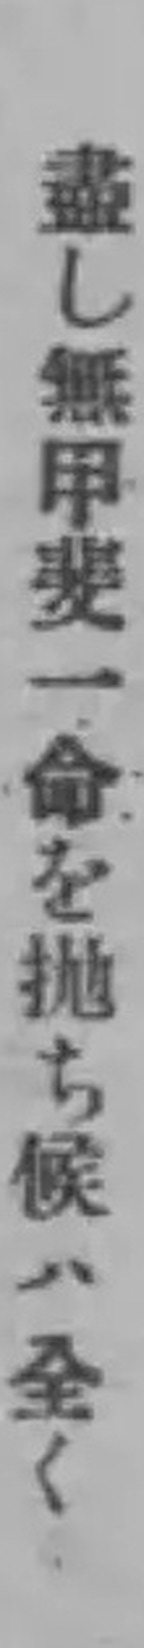尽し無甲斐一命を抛ち候は全く
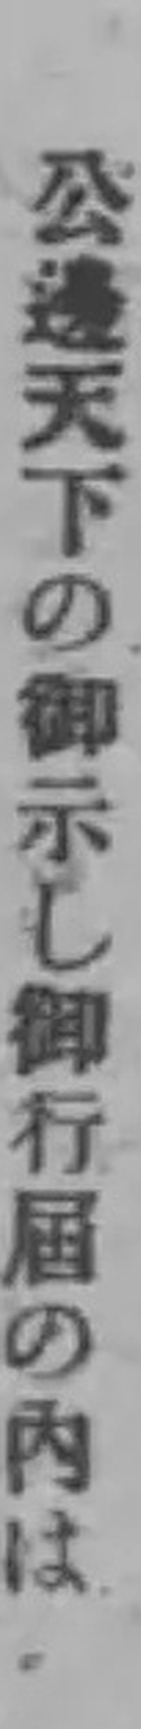公辺天下の御示し御行届の内は
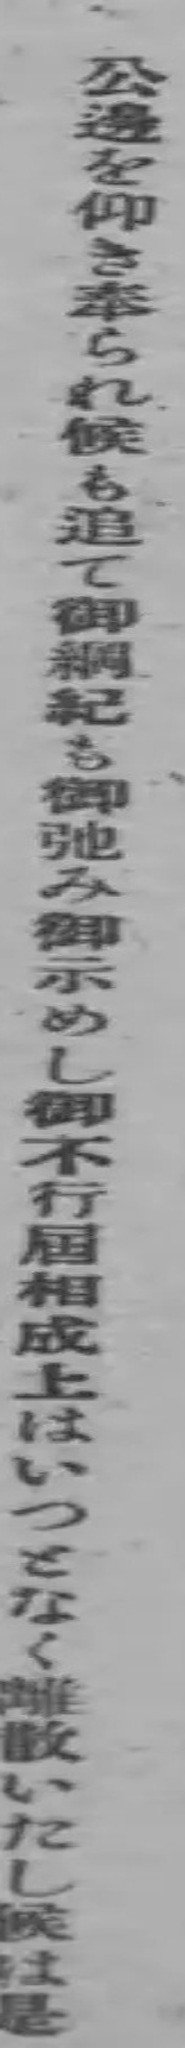公辺を仰き奉られ候も追て御綱紀も御緩み御示めし御不行届相成上はいつとなく離散いたし候は是
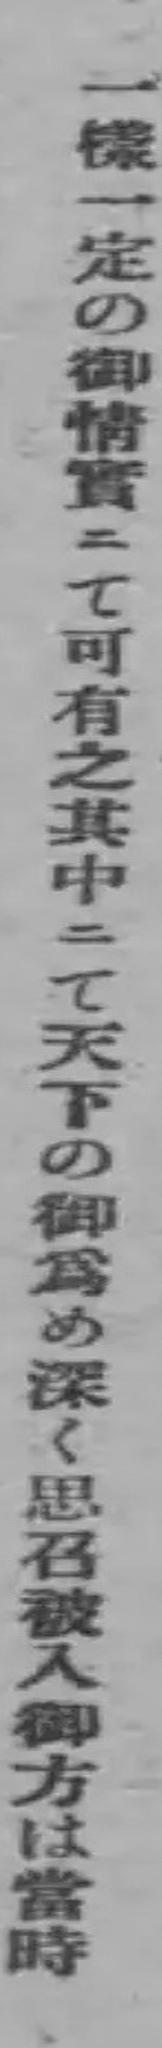一様一定の御情実ニて可有之其中ニて天下の御為め深く思召被入御方は当時
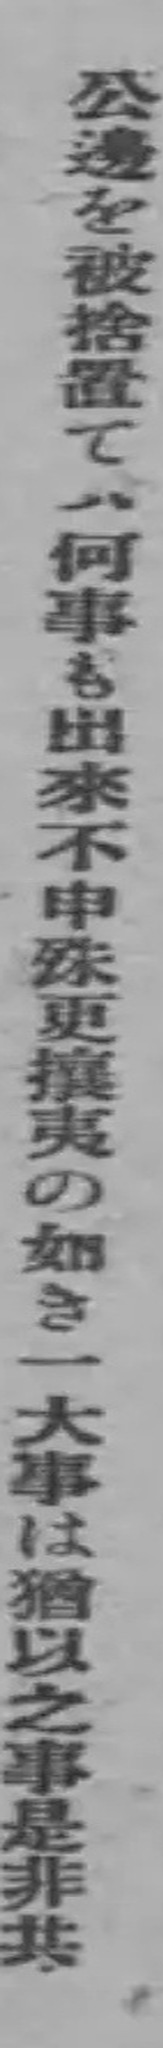公辺を被捨置ては何事も出来不申殊更攘夷の如き一大事は猶以之事是非共
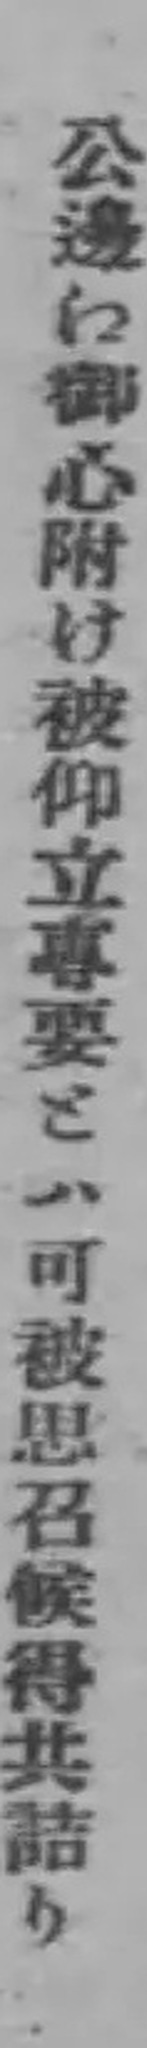公辺え御心附け被仰立専要とは可被思召候得共詰り
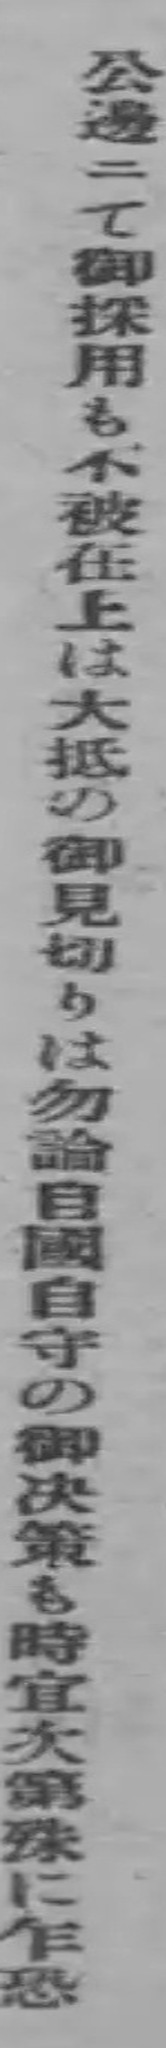公辺ニて御採用も不被在上は大抵の御見切りは勿論自国自守の御決策も時宜次第殊に乍恐
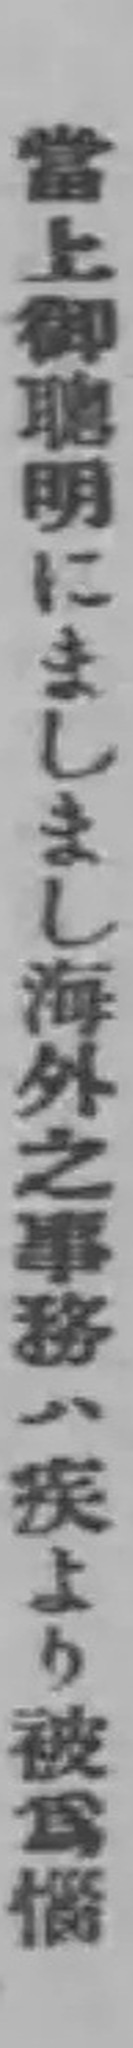当上御聡明にましまし海外之事務は疾より被為悩
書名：豊橋市史談
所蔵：国立国会図書館 National Diet Library, JAPAN
